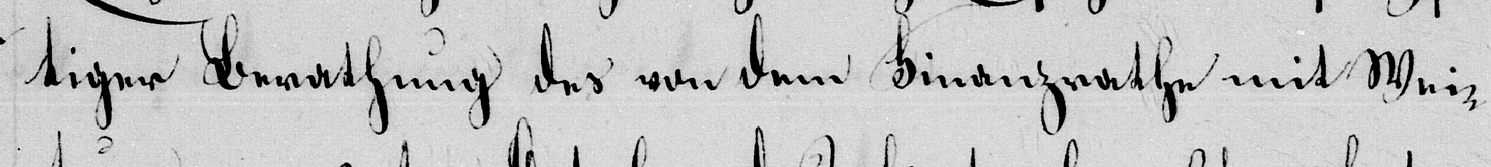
tiger Berathung des von dem Finanzrathe mit Wei¬
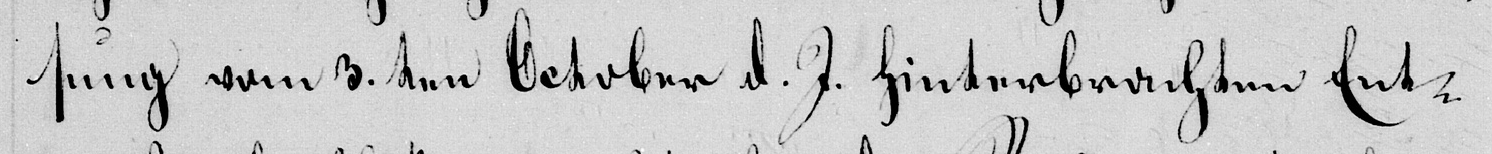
sung vom 3.ten October d. J. hinterbrachten Ent¬
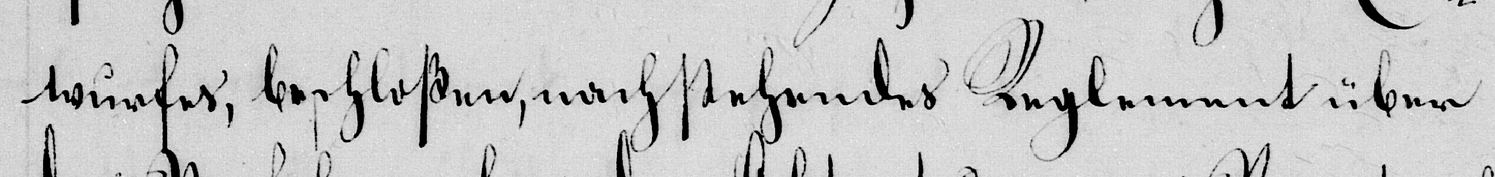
wurfes, beschloßen, nachstehendes Reglement über
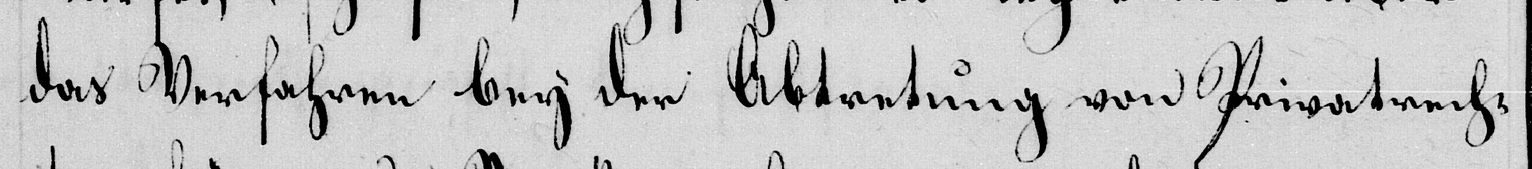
das Verfahren bey der Abtretung von Privatrech¬
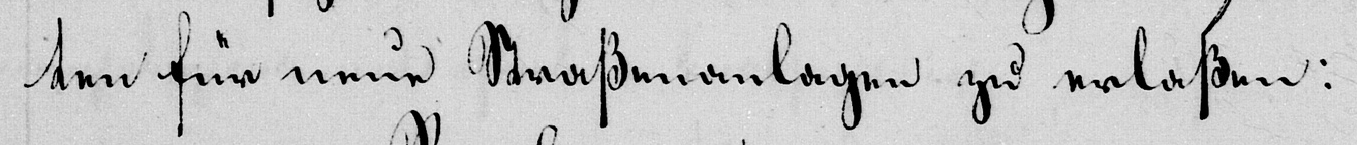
ten für neue Straßenanlagen zu erlaßen:
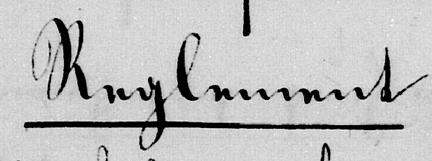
Reglement
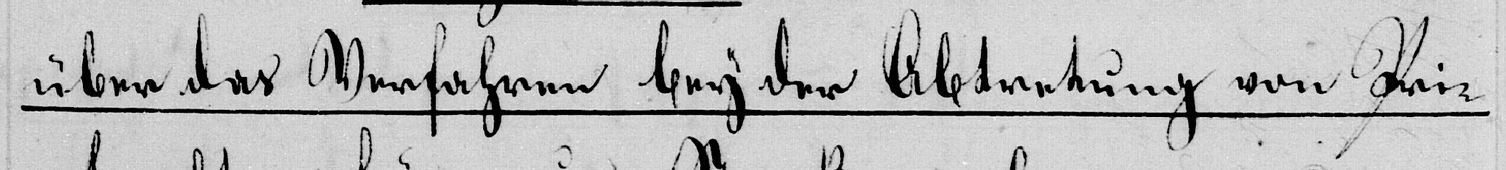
über das Verfahren bey der Abtretung von Pri¬
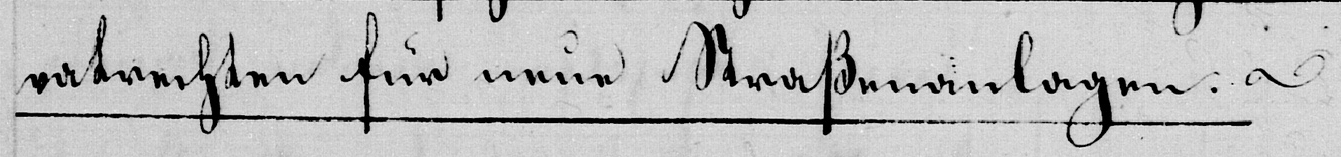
vatrechten für neue Straßenanlagen.
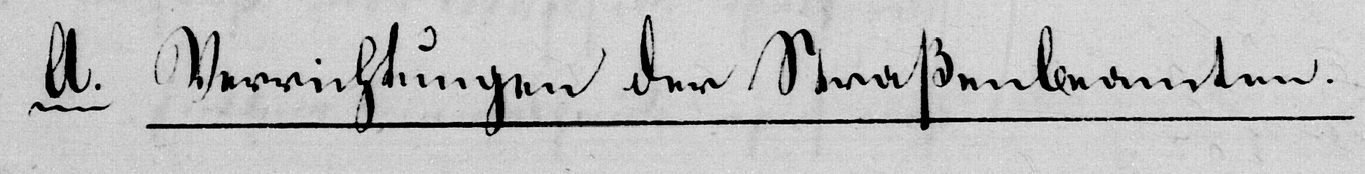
A. Verrichtungen der Straßenbeamten.
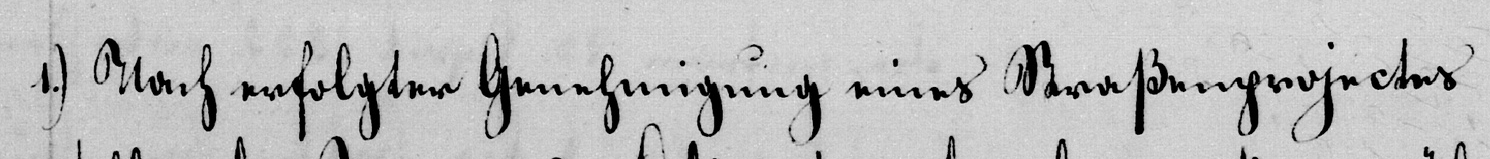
1.) Nach erfolgter Genehmigung eines Straßenprojectes
